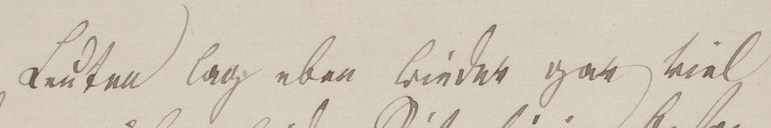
Leuten lag eben wieder gar viel
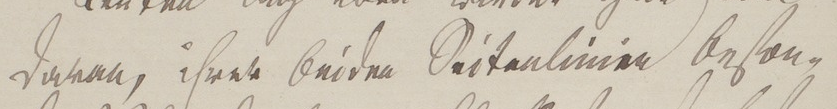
daran, ihrer beiden Seitenlinien beson-
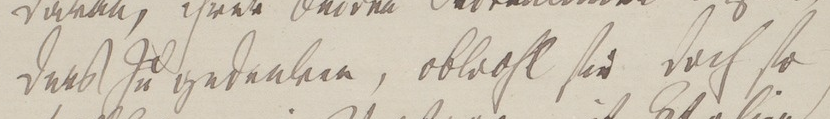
ders zu gedenken, obwohl sie doch so
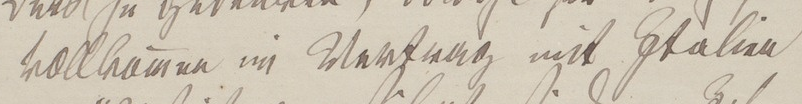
vollkommen im Vertrag mit Italien
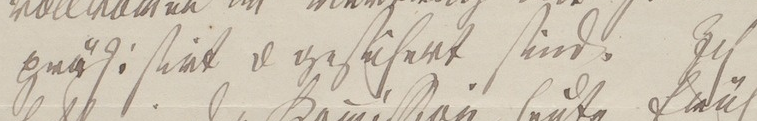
präzisirt & gesichert sind. Ich
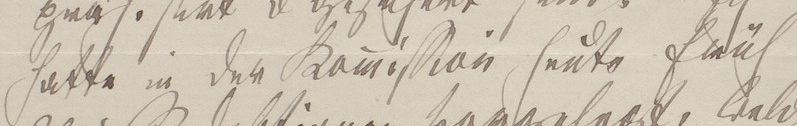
hatte in der Kommission heute früh
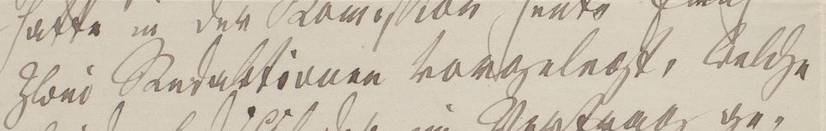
zwei Redaktionen vorgelegt, welche
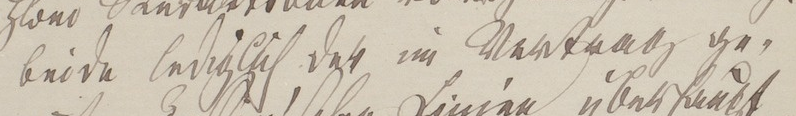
beide lediglich der im Vertrag ge-
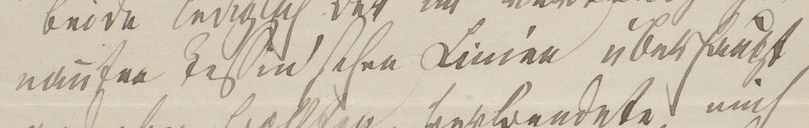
nannten Tessin'schen Linien überhaupt
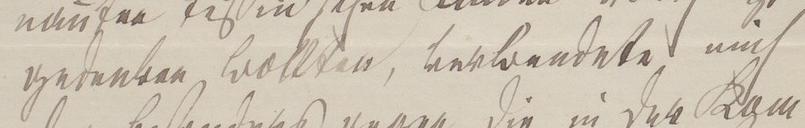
gedenken wollten, verwendete mich
